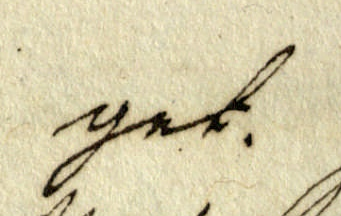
get.
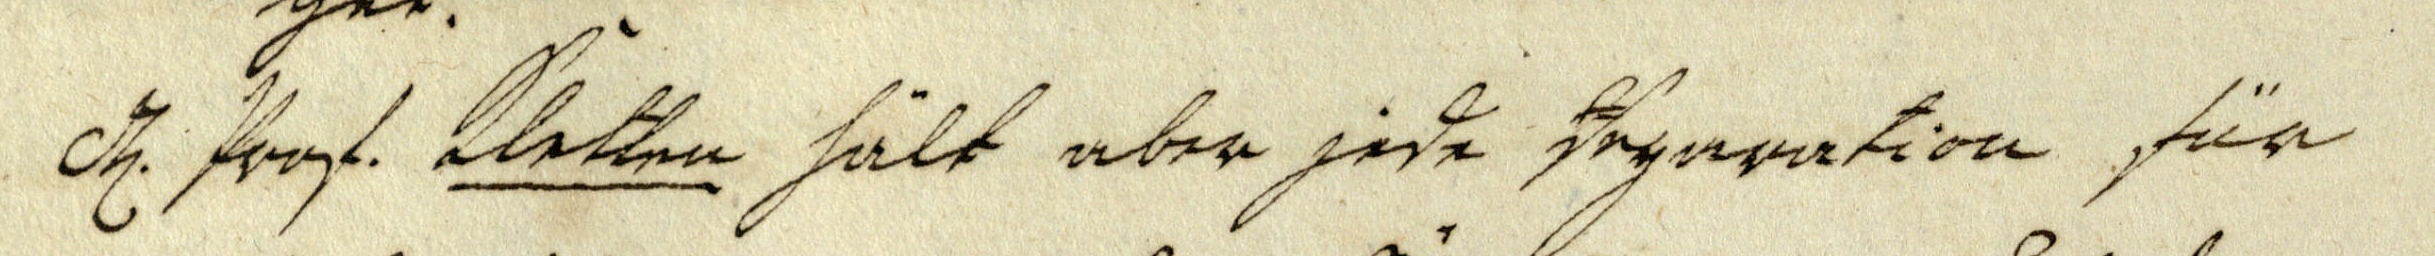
dh. Prof. Kletten hält aber jede Reparation für
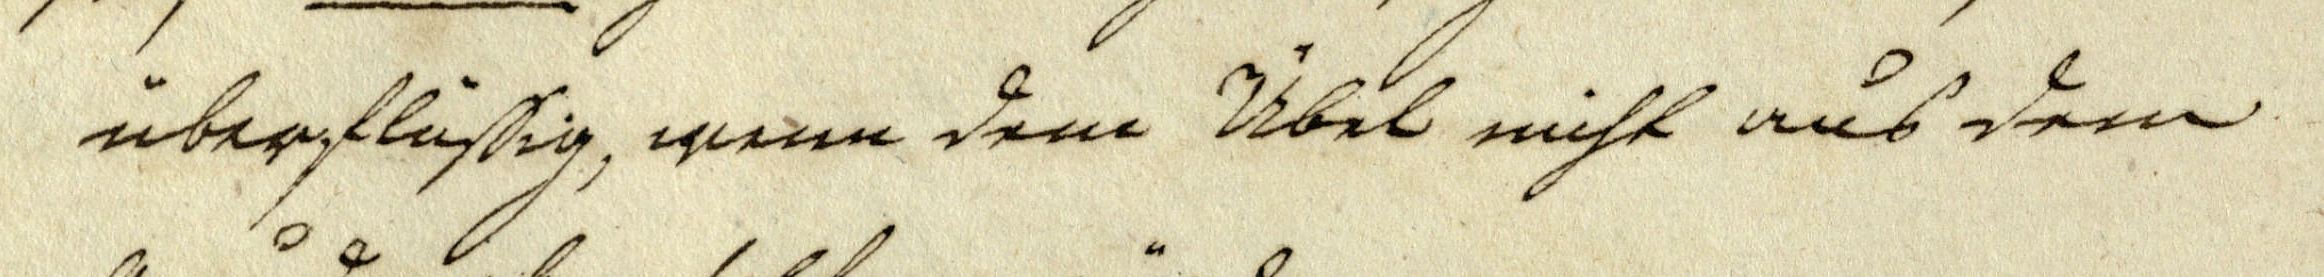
überflüssig, wenn dem Übel nicht aus dem
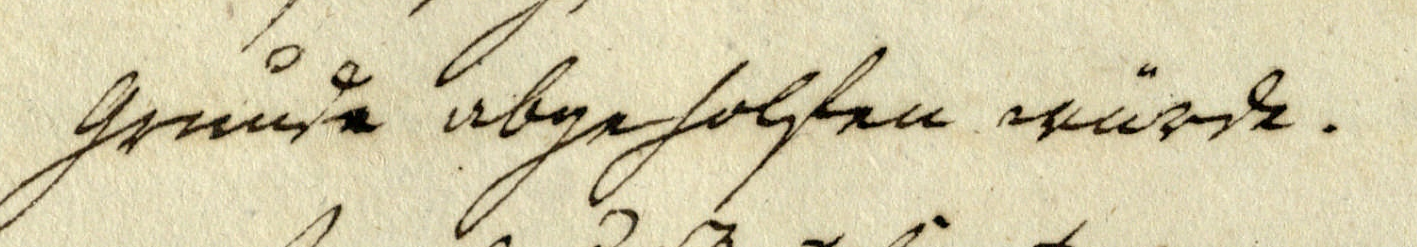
Grunde abgeholfen würde.
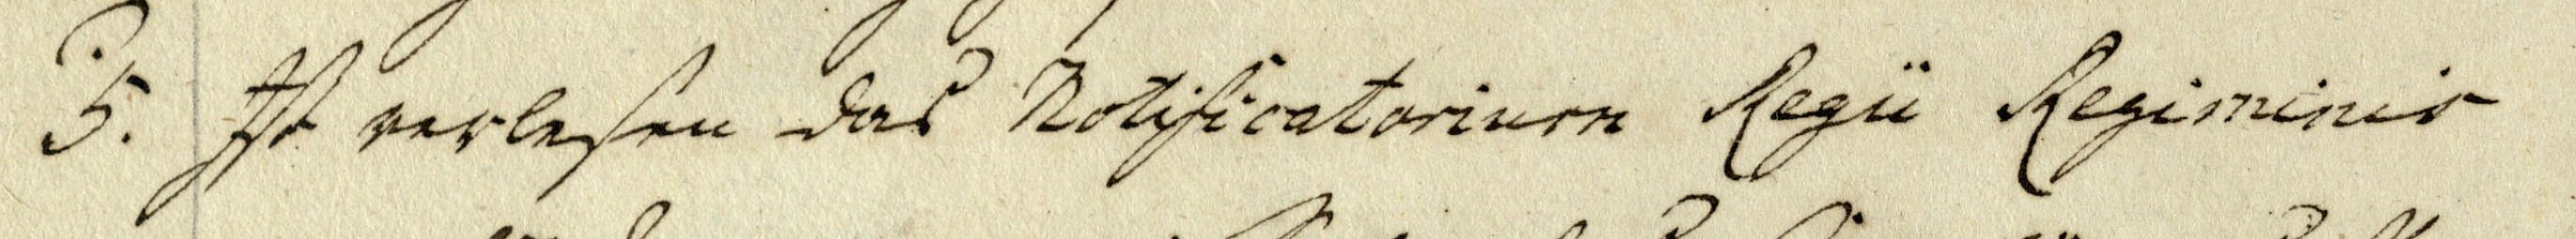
5. Ist verlesen das Notificatorium regii Regiminis
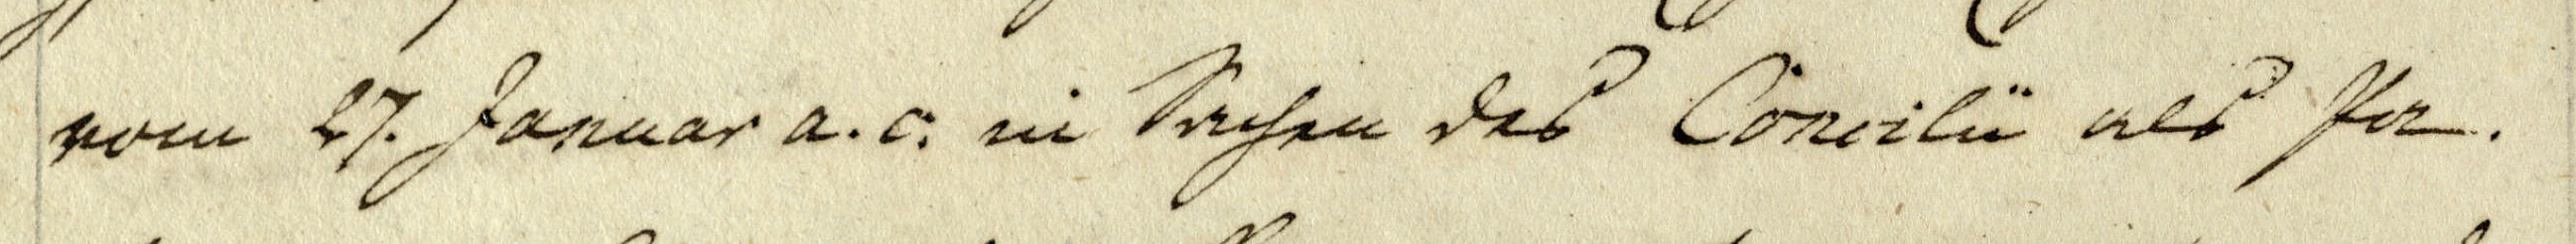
vom 27. Januar a. c. in Sachen des Concilii als Pa¬
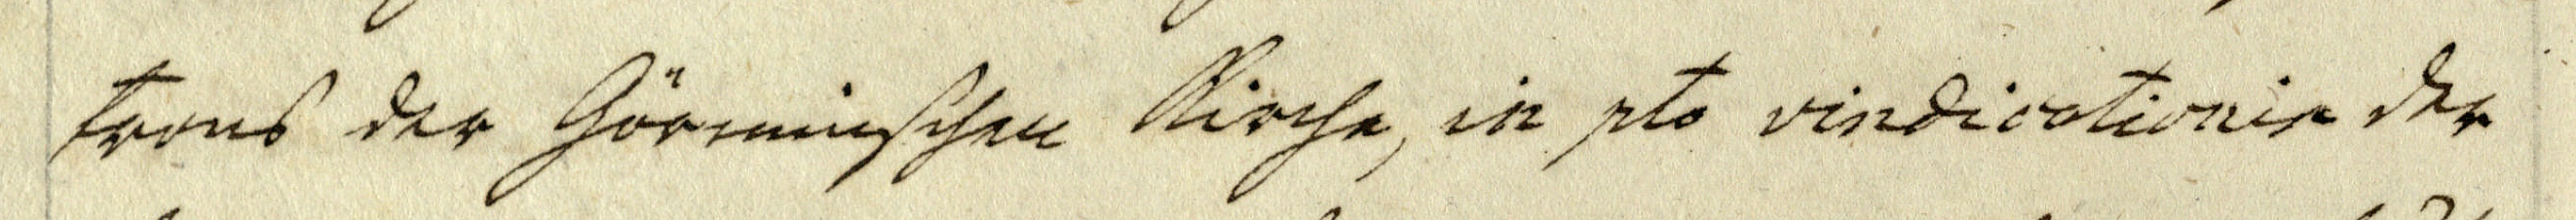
trons der Görminschen Kirche, in pto vindicationis der
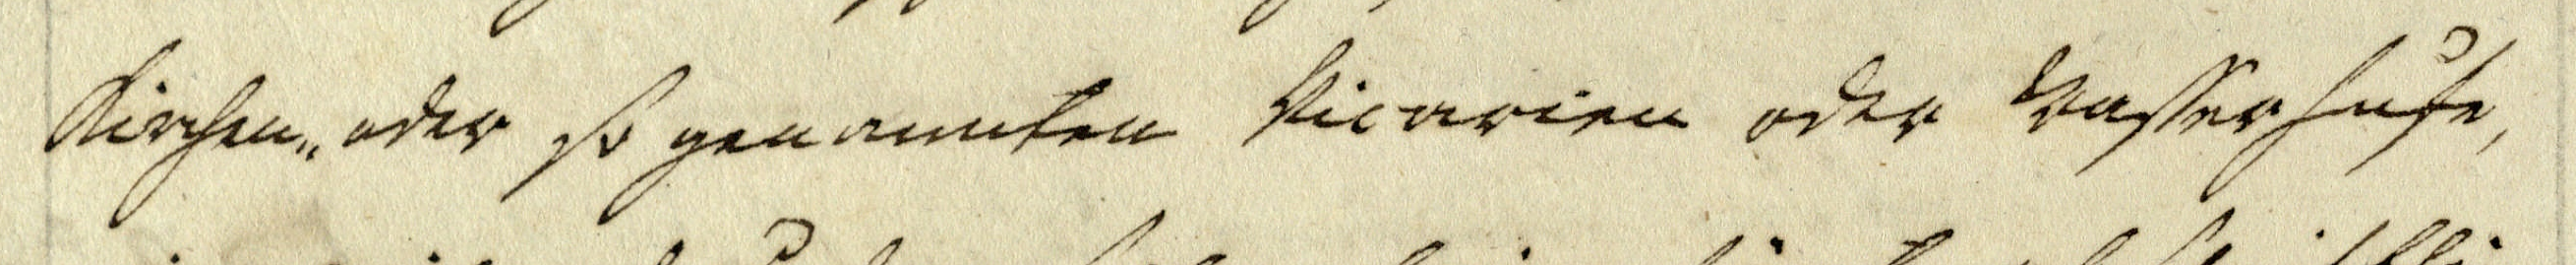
Kirchen- oder so genannten Vicarien oder Wasserhufe,
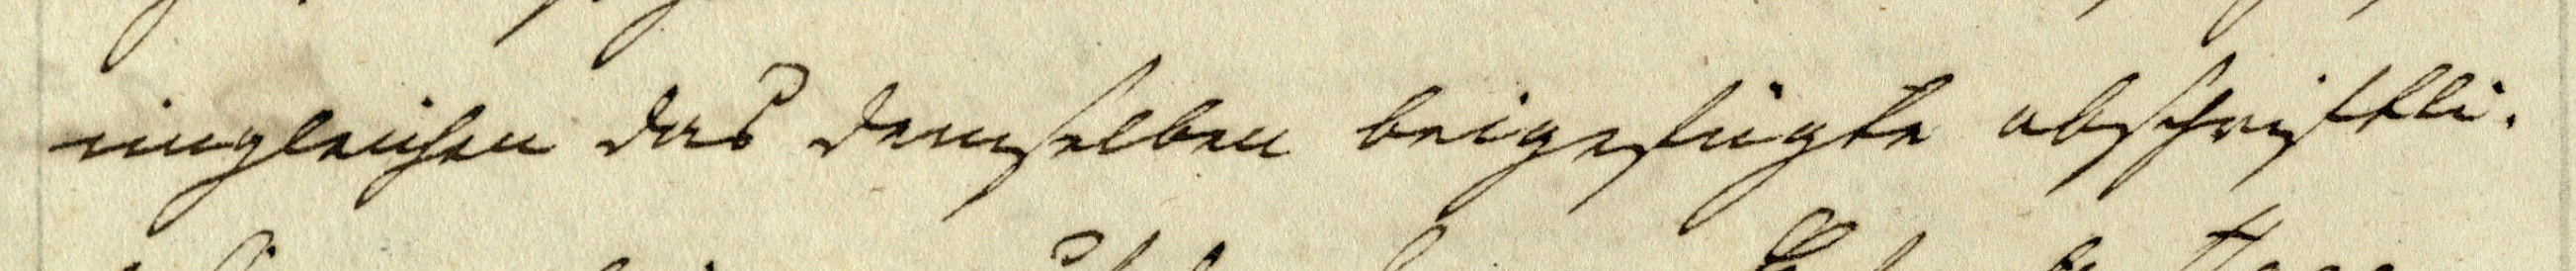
imgleichen das demselben beigefügte abschriftli¬
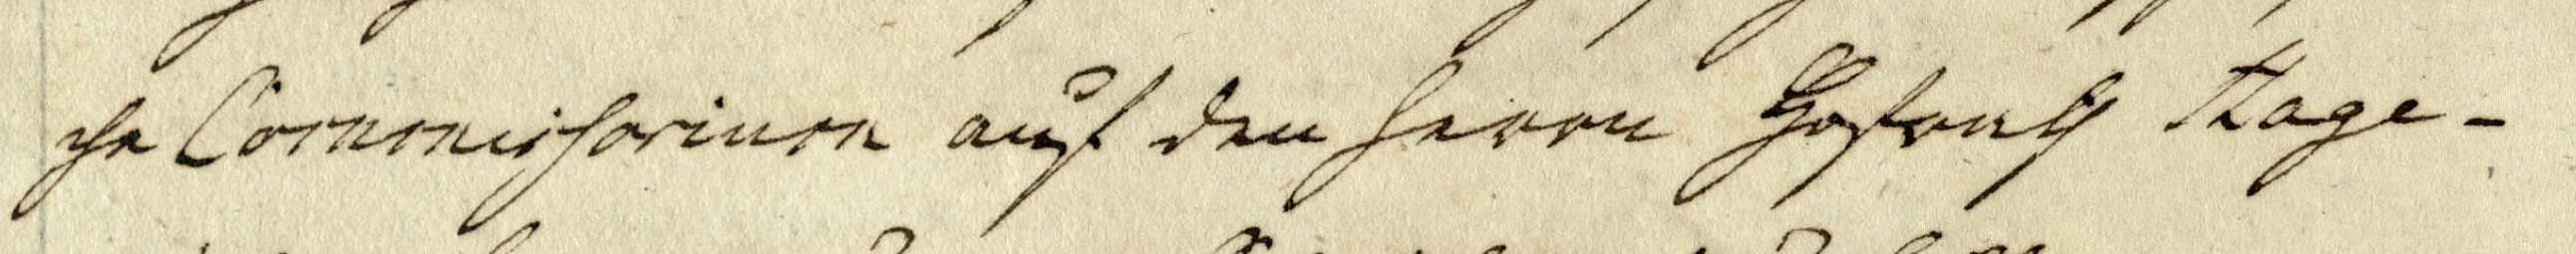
che Commissorium auf den Herrn Hofrath Hage
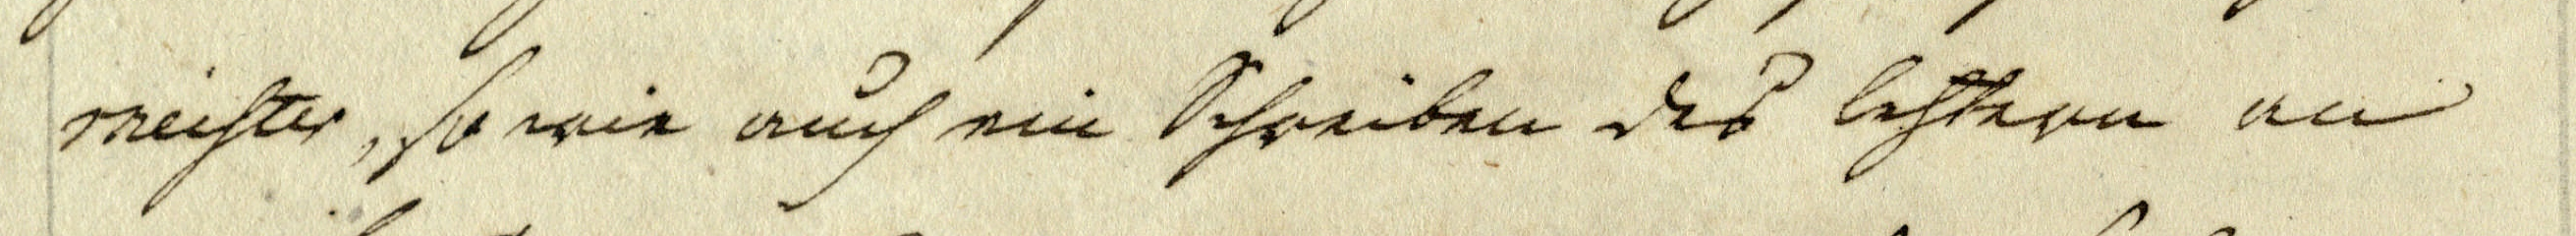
meister, so wie auch ein Schreiben des letztern an
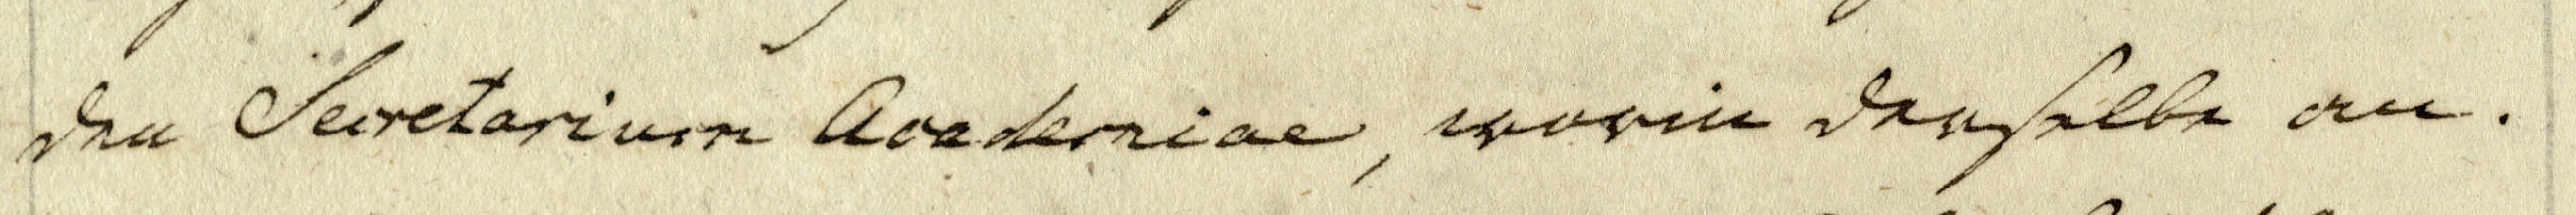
den Secretarium Academiae, worin derselbe an¬
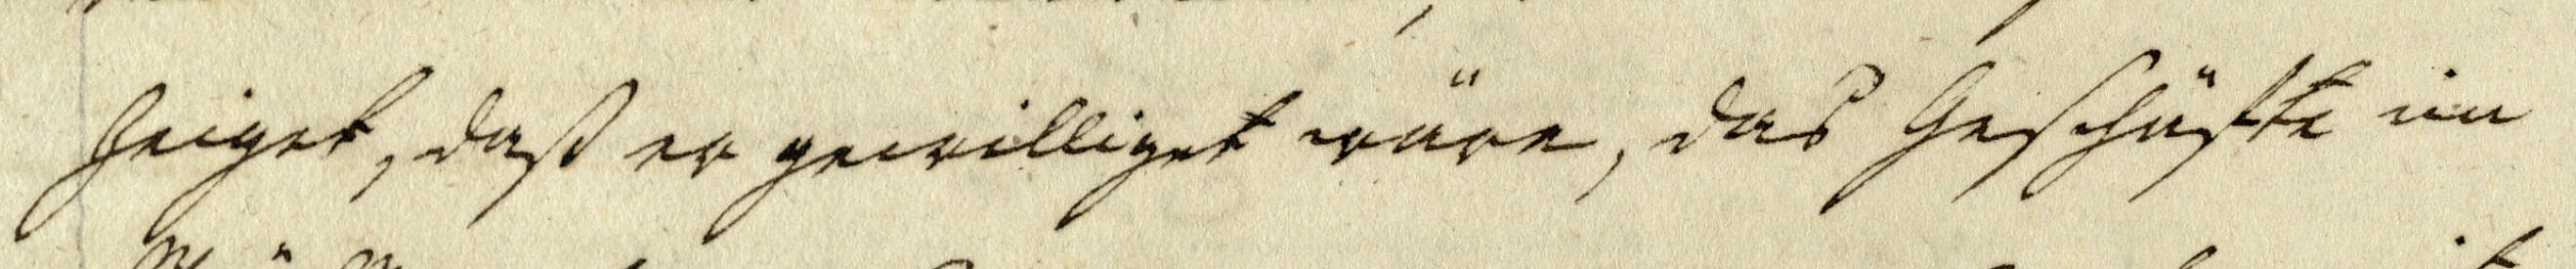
zeiget, daß er gewilliget wäre, das Geschäfte im
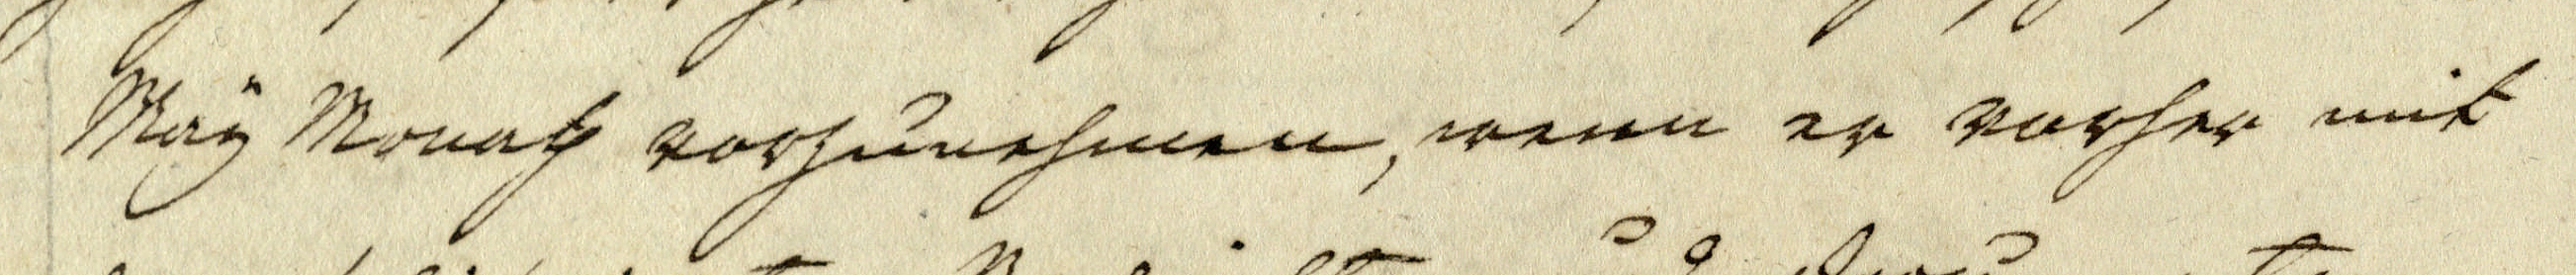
Maÿ Monath vorzunehmen, wenn er vorher mit
